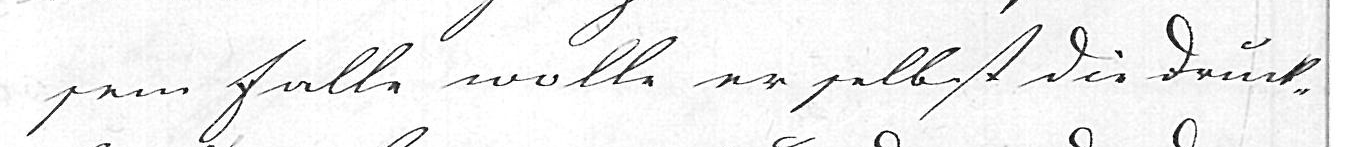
sem Falle wolle er selbst die Druck-
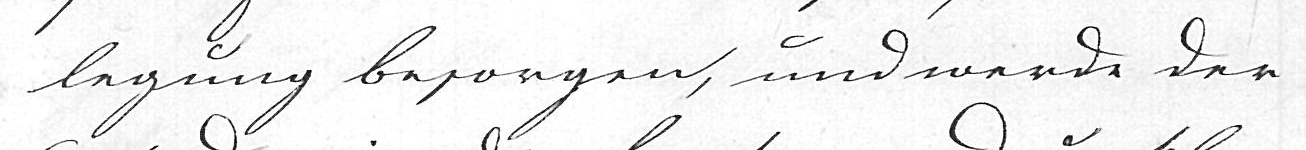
legung besorgen, und werde der
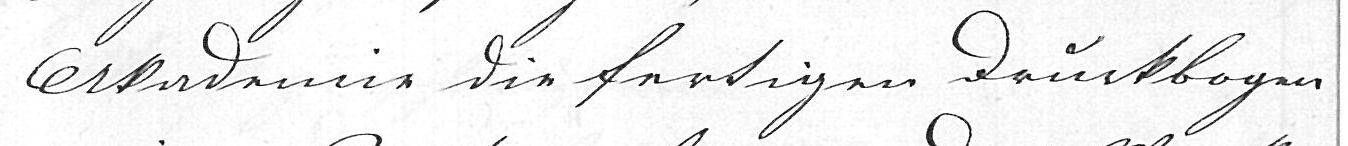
Akademie die fertigen Druckbogen
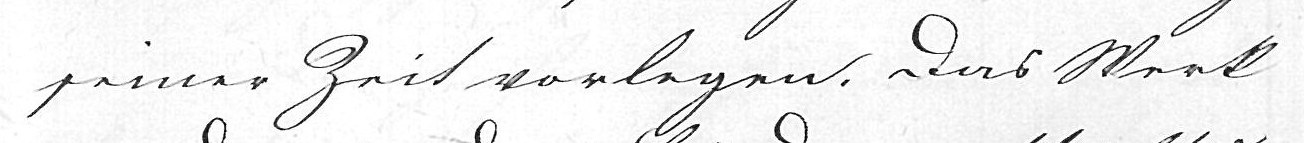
seiner Zeit vorlegen. Das Werk
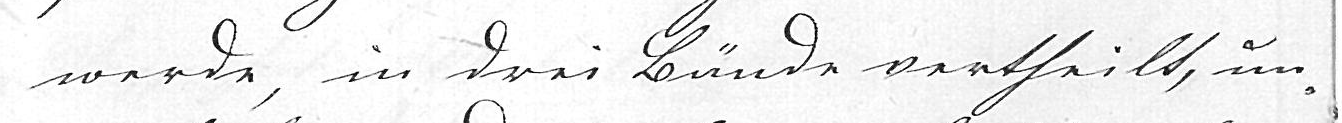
werde in drei Bände vertheilt, un-
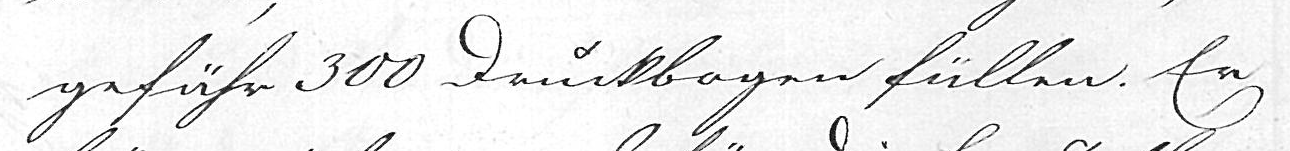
gefähr 300 Druckbogen füllen. Er
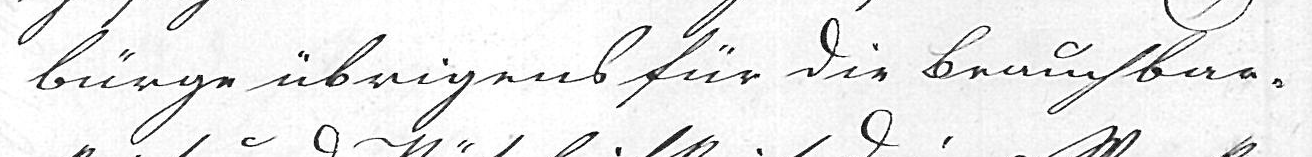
bürge übrigens für die brauchbar-
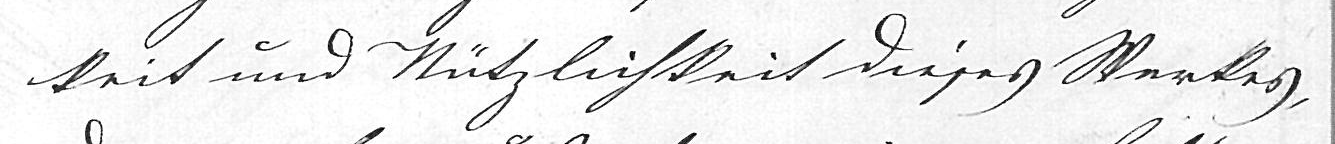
keit und Nützlichkeit dieses Werkes,
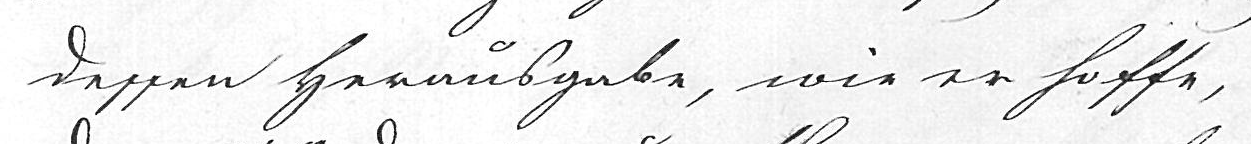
dessen Herausgabe, wie er hoffe,
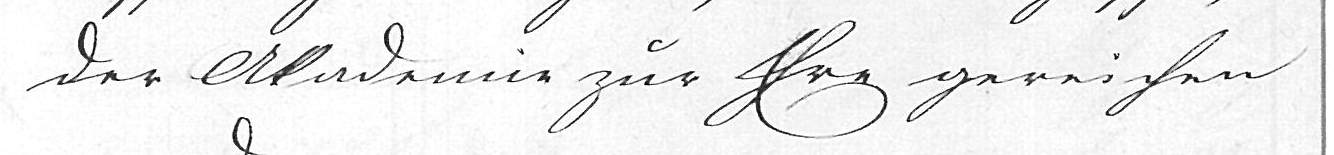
der Akademie zur Ehre gereichen
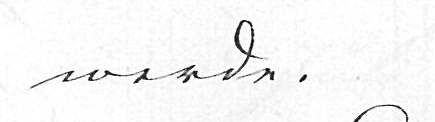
werde.
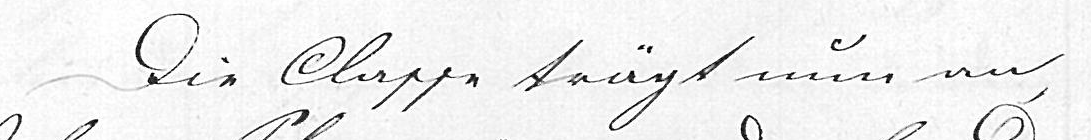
Die Classe trägt nun an,
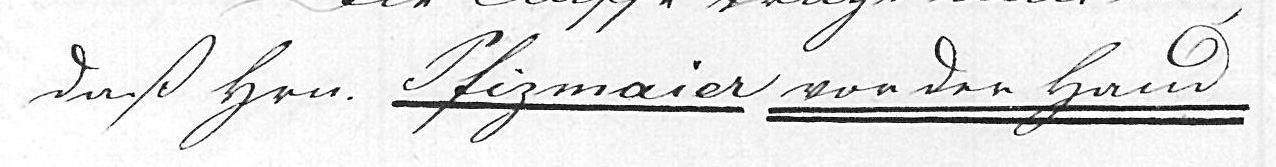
daß Hrn. Pfizmaier vor der Hand
